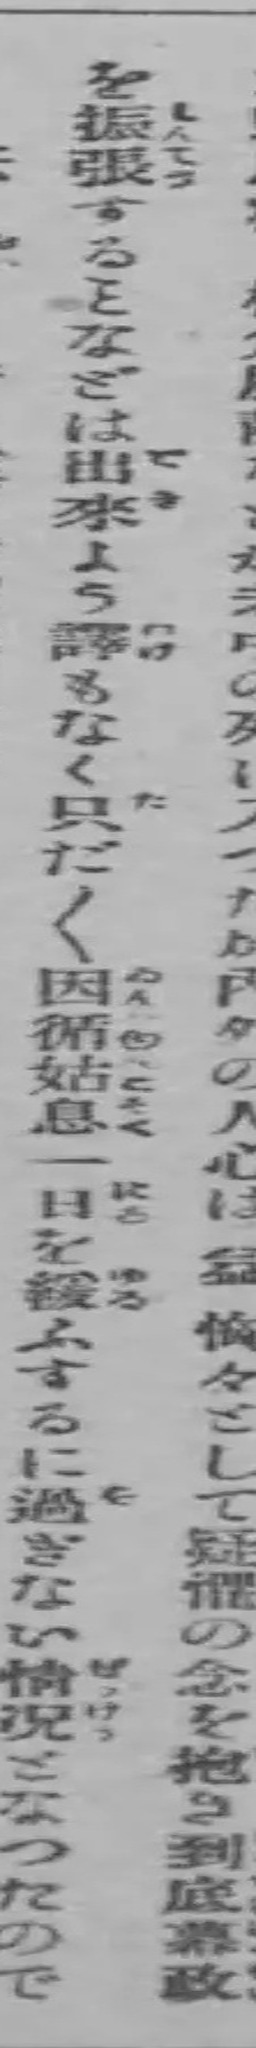を振張することなどは出来よう訳もなく只だ〳〵因循姑息一日を緩ふするに過ぎない情況となつたので
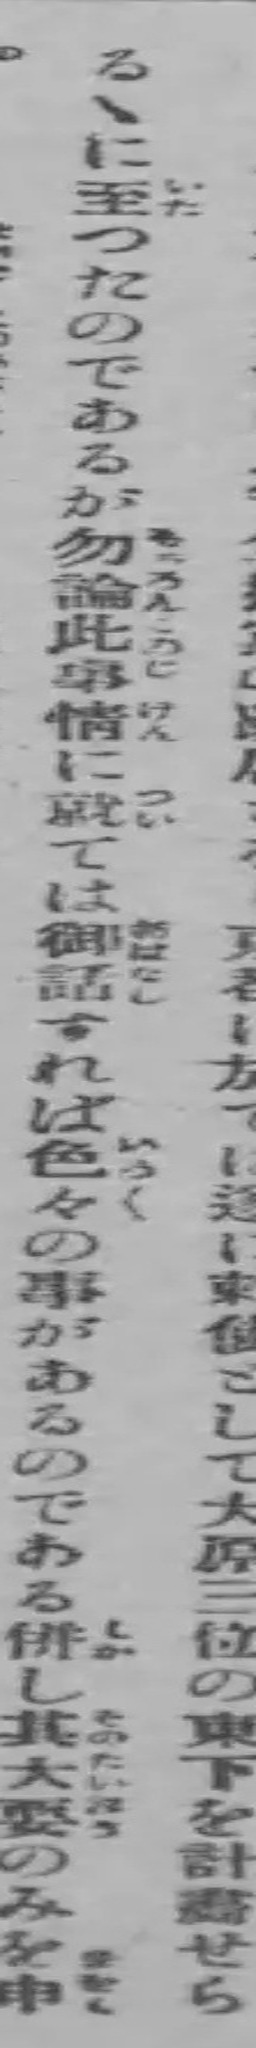るゝに至つたのであるが勿論此事情に就ては御話すれば色々の事があるのである併し其大要のみを申
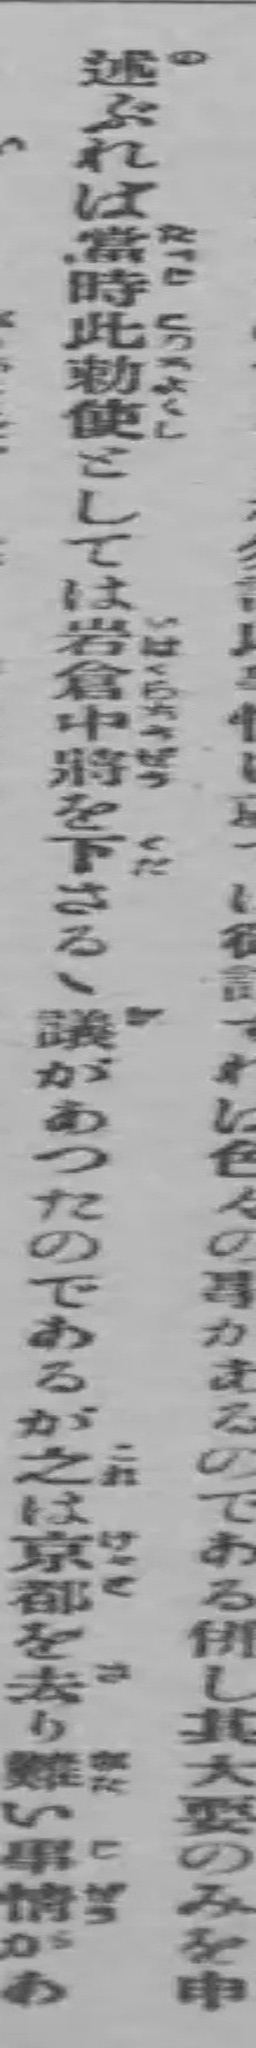述ぶれば当時此勅使としては岩倉中将を下さるゝ議があつたのであるが之は京都を去り難い事情があ
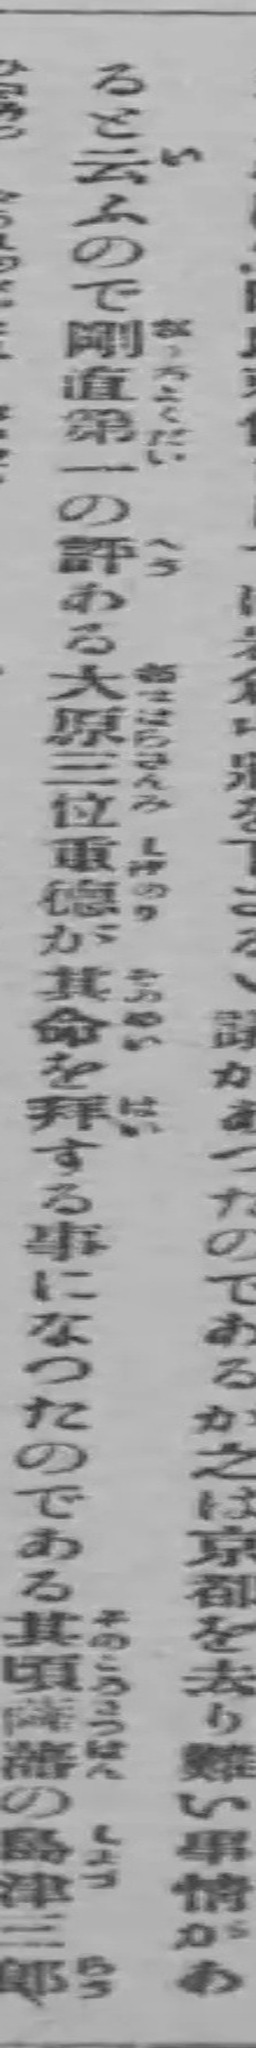ると云ふので剛直第一の評のある大原三位重徳が其命を拝する事になつたのである其頃薩藩の島津三郎
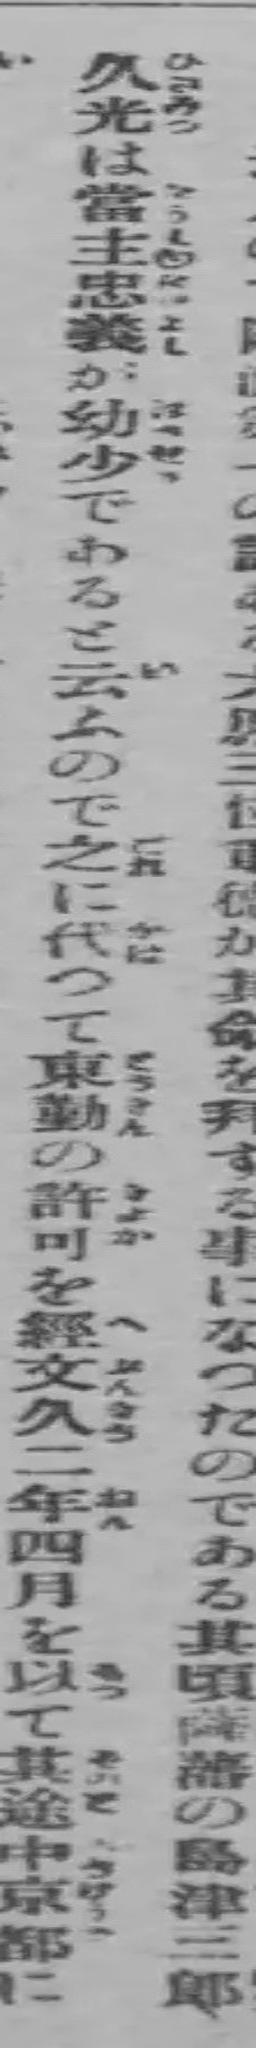久光は当主忠義が幼少であると云ふので之に代つて東勤の許可を経文久二年四月を以て其途中京都に
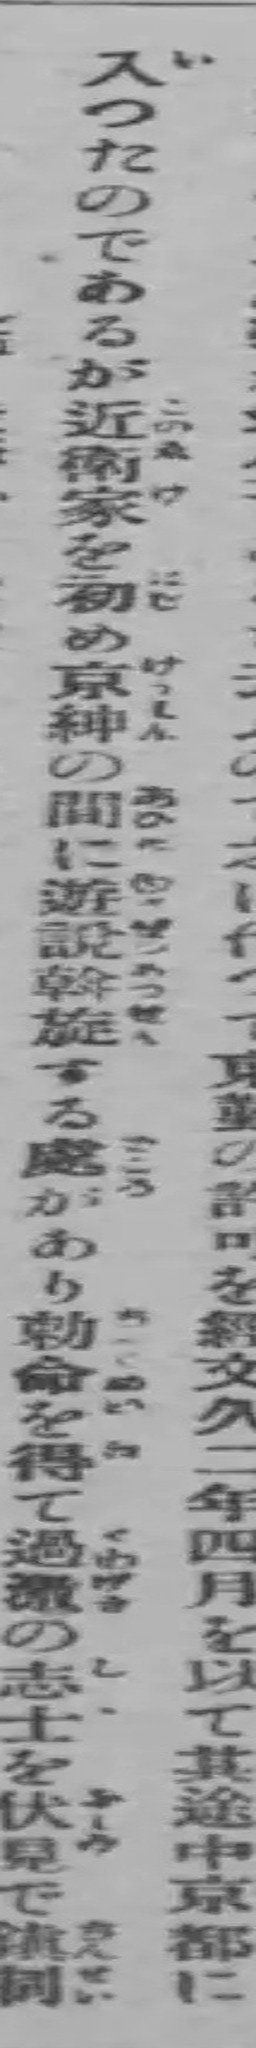入つたのであるが近衛家を初め京紳の間に遊説斡旋する処があり勅命を得て過激の志士を伏見で鎮制
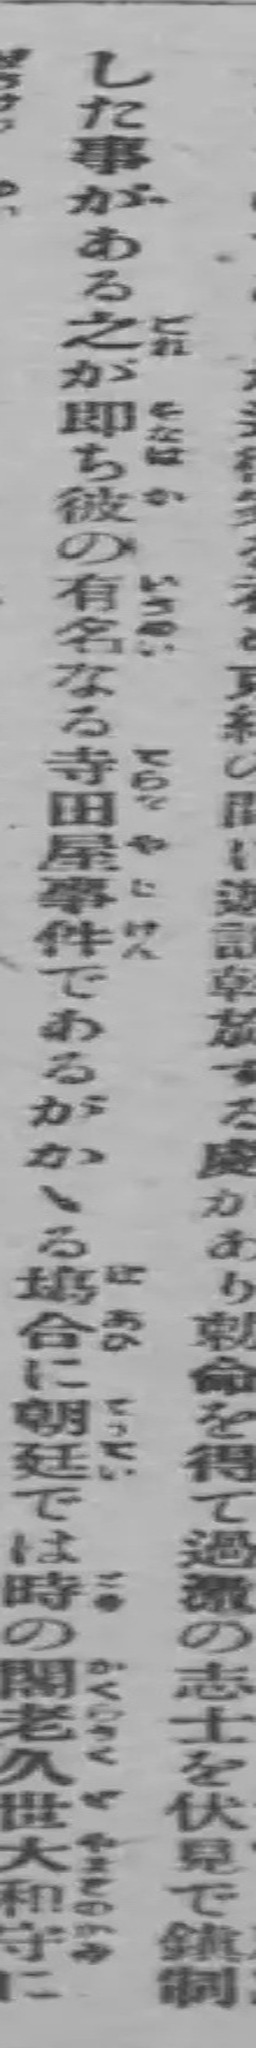した事がある之が即ち彼の有名なる寺田屋事件であるがかゝる場合に朝廷では時の閣老久世大和守に
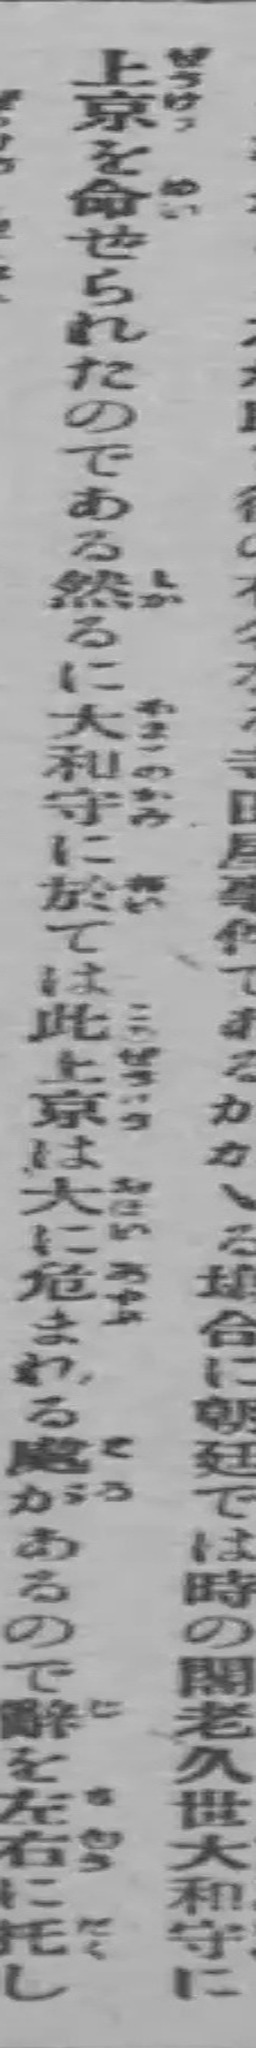上京を命ぜられたのである然るに大和守に於ては此上京は大に危まれる処があるので辞を左右に托し
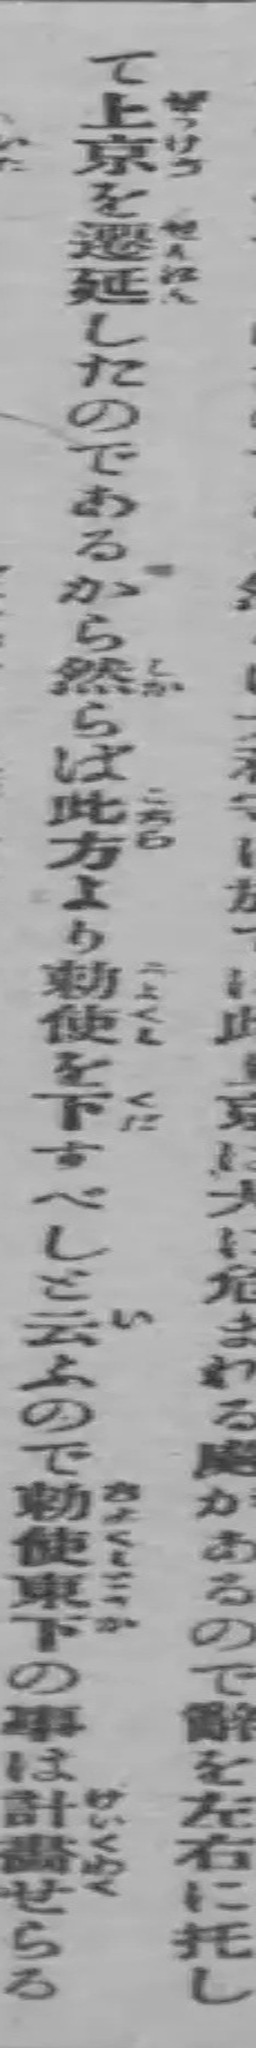て上京を遷延したのであるから然らば此方より勅使を下すべしと云ふので勅使東下の事は計画せらる
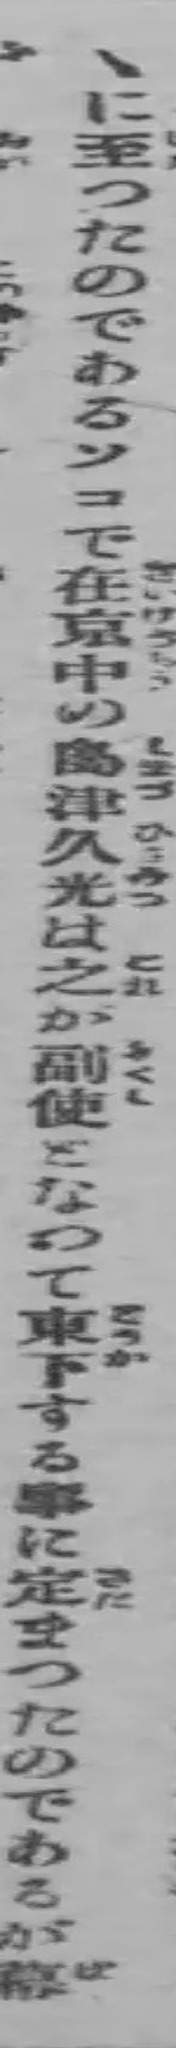ゝに至つたのであるソコで在京中の島津久光は之が副使となつて東下する事に定まつたのであるが幕
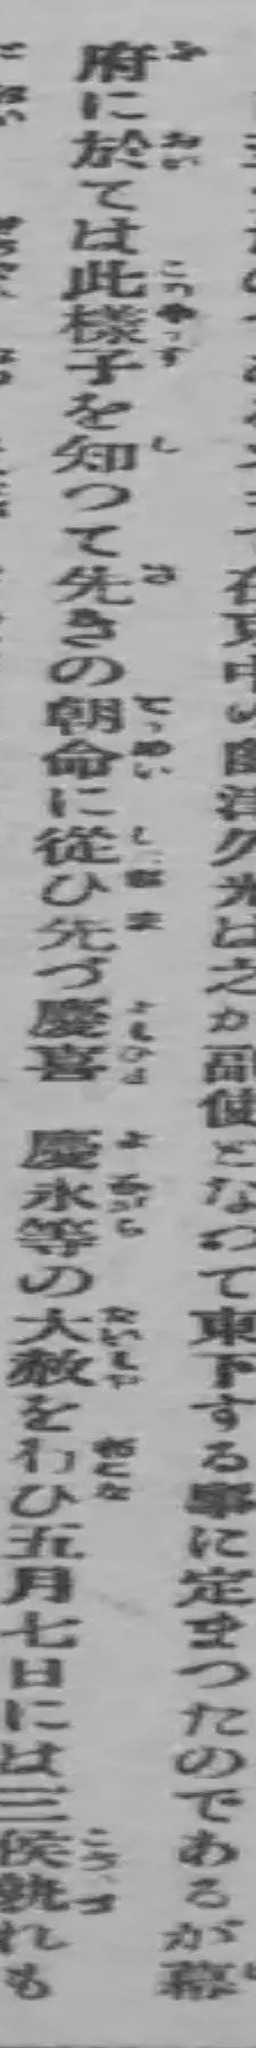府に於ては此様子を知つて先の朝命に従ひ先づ慶喜、慶永等の大赦を行ひ五月七日には三侯孰れも
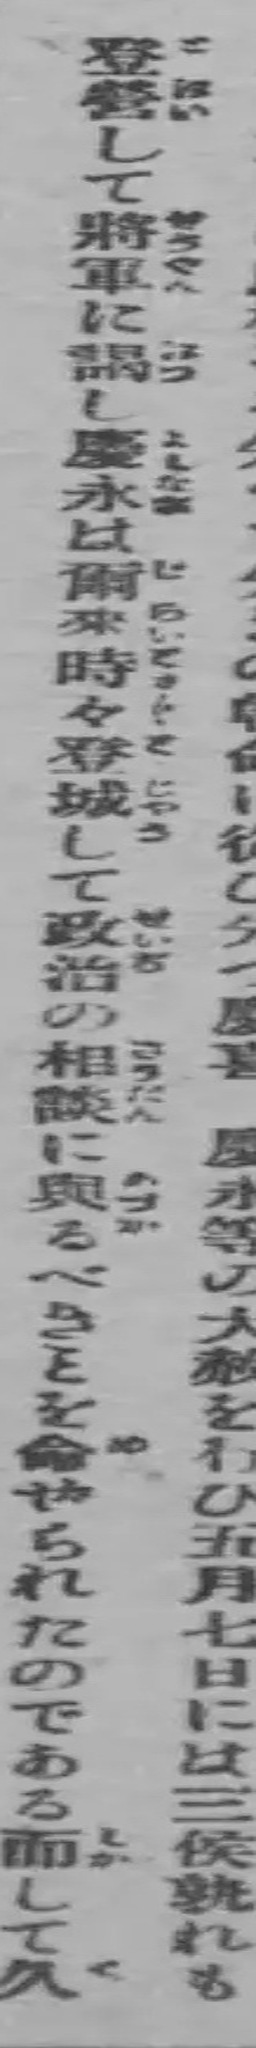登営して将軍に謁し慶永は爾来時々登城して政治の相談に与るべきことを命ぜられたのである而して久
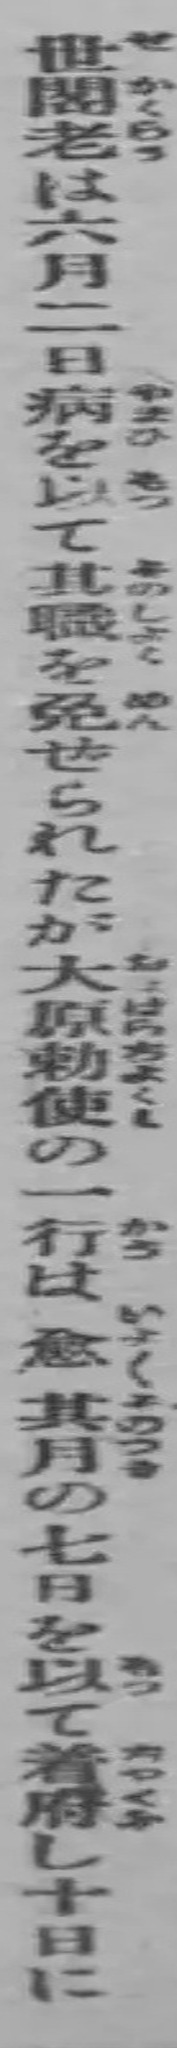世閣老は六月二日病を以て其職を免ぜられたが大原勅使の一行は愈其月の七日を以て着府し十日に
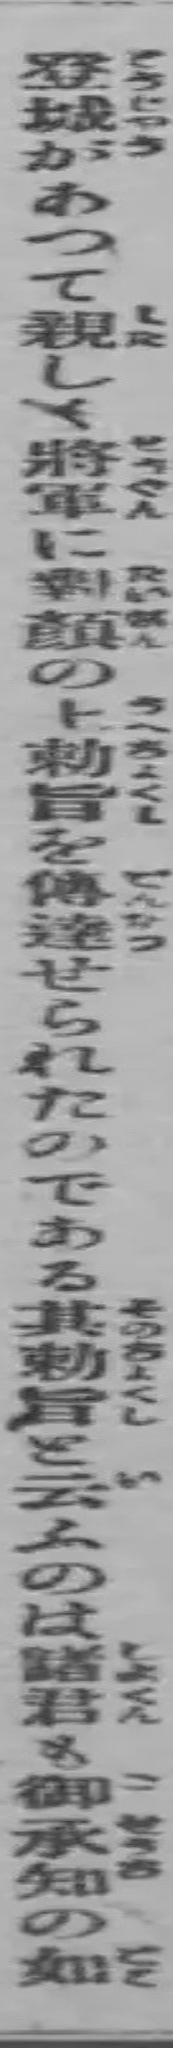登城があつて親しく将軍に対顔の上勅旨を伝達せられたのである其勅旨と云ふのは諸君も御承知の如
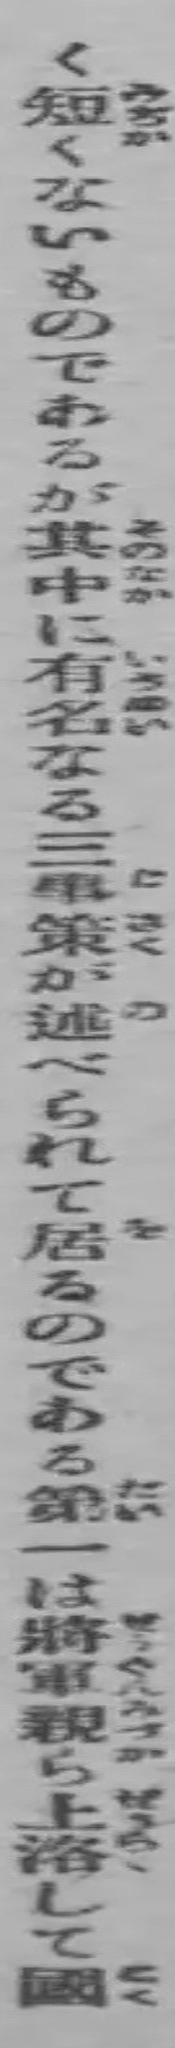く短くないものであるが其中に有名なる三事策が述べられて居るのである第一は将軍親ら上洛して国
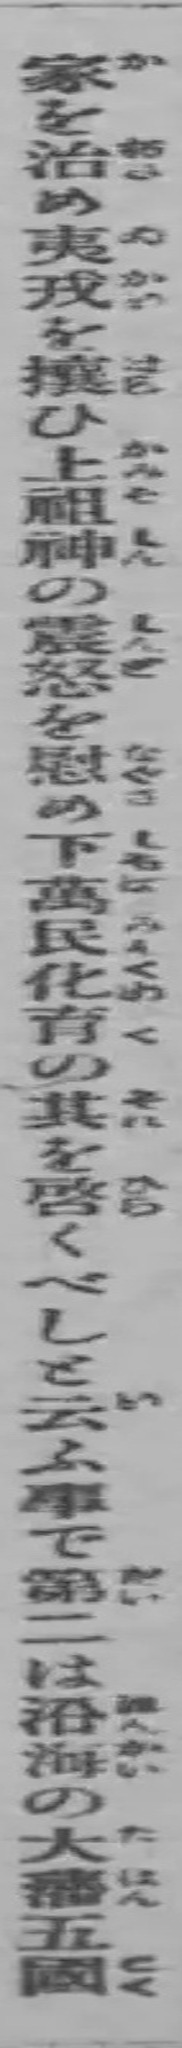家を治め夷戎を攘ひ上祖神の震怒を慰め下万民化育の其を啓くべしと云ふ事で第二は沿海の大藩五国
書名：豊橋市史談
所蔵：国立国会図書館 National Diet Library, JAPAN
